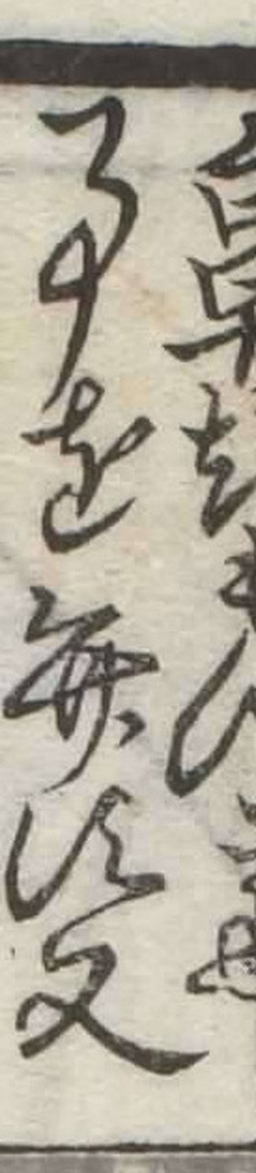事を弁す又
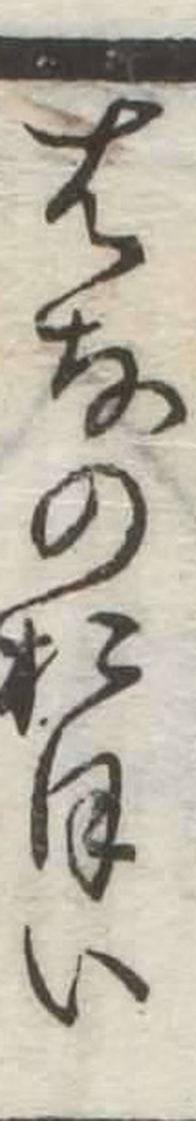はなのおほい
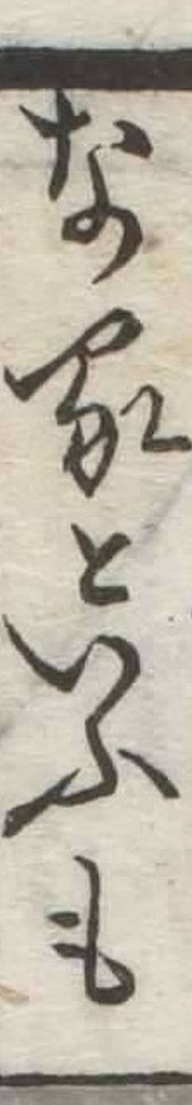なるといふも
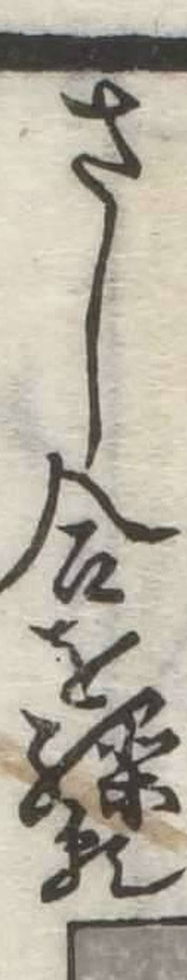さし合を繰歟
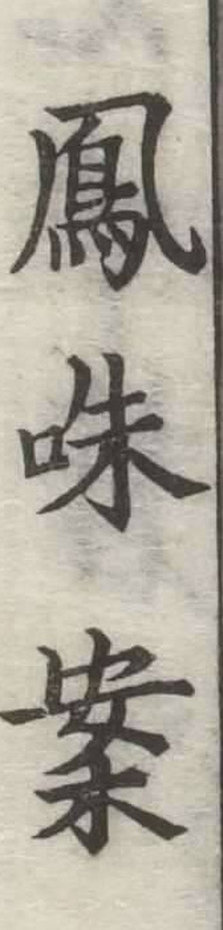鳳咮案
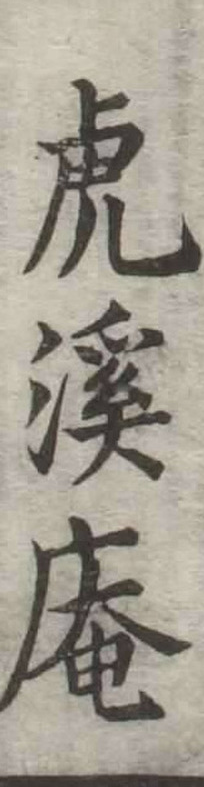虎渓庵
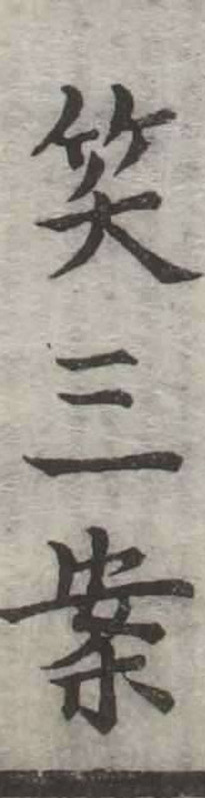笑三案

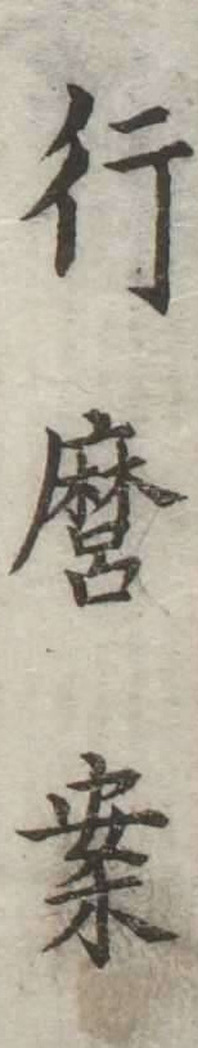行麿案
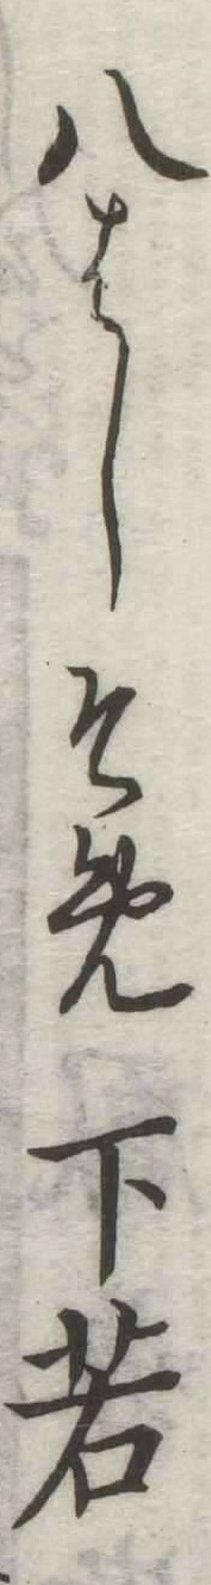八はしそめ下若
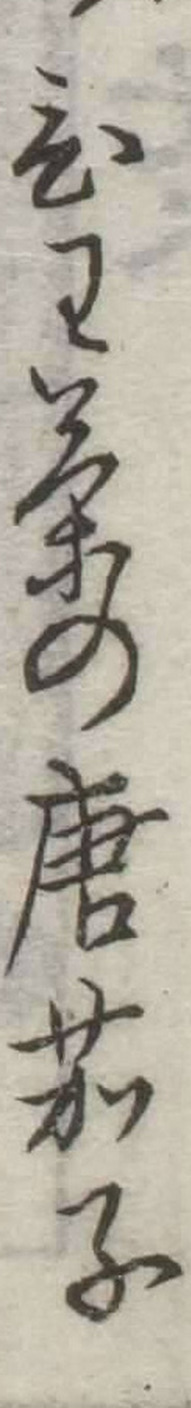ひわ茶の唐茄子
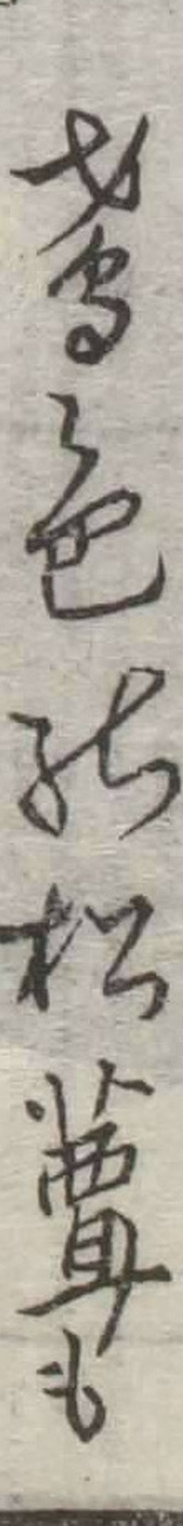鳶色の松茸も
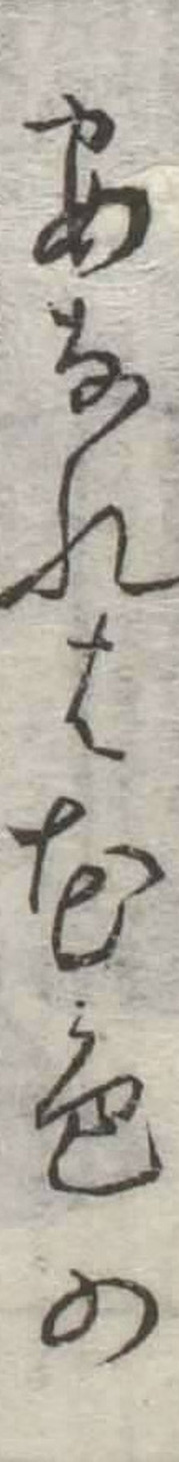安なれは花色の
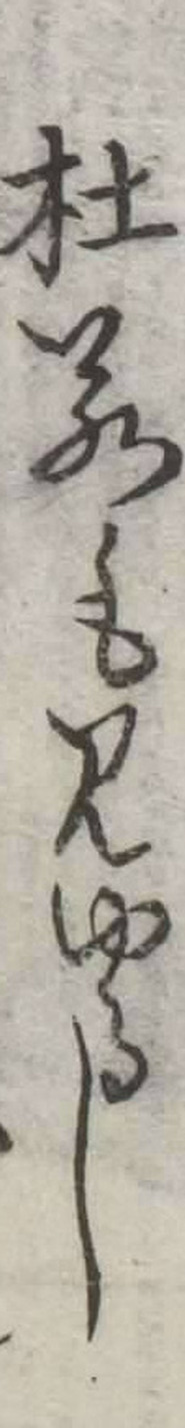杜若も見ゆるし
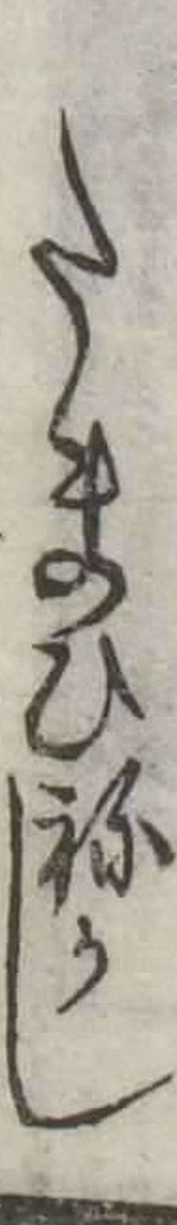たまひねかし
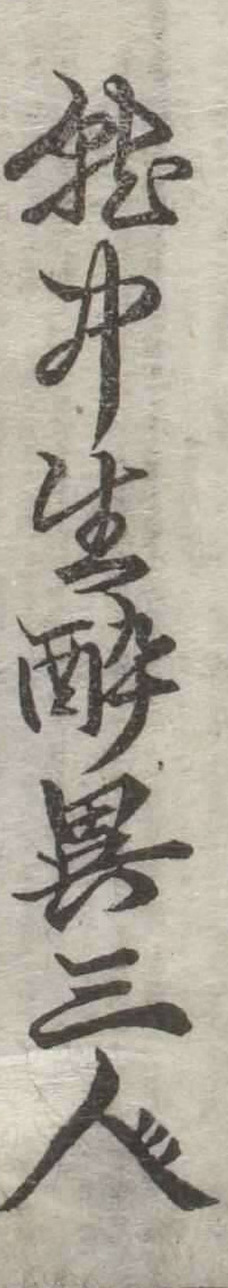就中生酔異三人
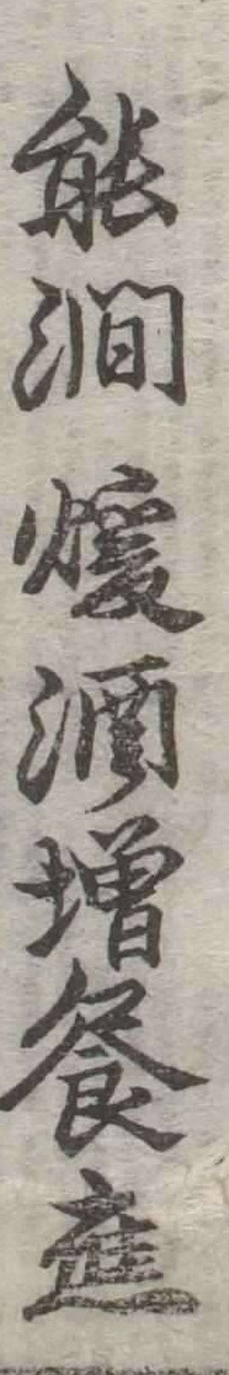能澗煖酒増饗応
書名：たなくひあわせ
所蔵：国文学研究資料館
